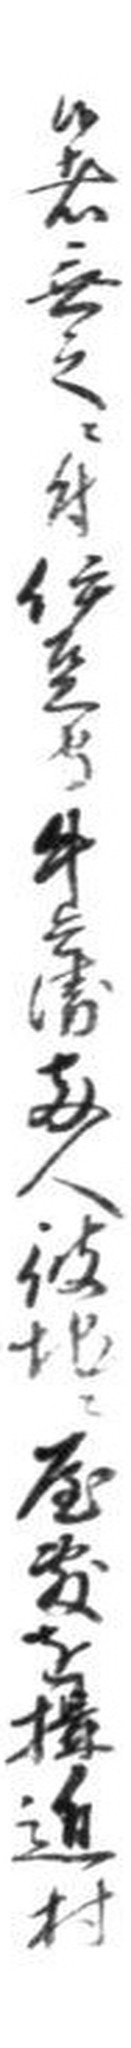候者無之ニ付伊豆守牛兵衛両人彼地ニ屋敷を構近村
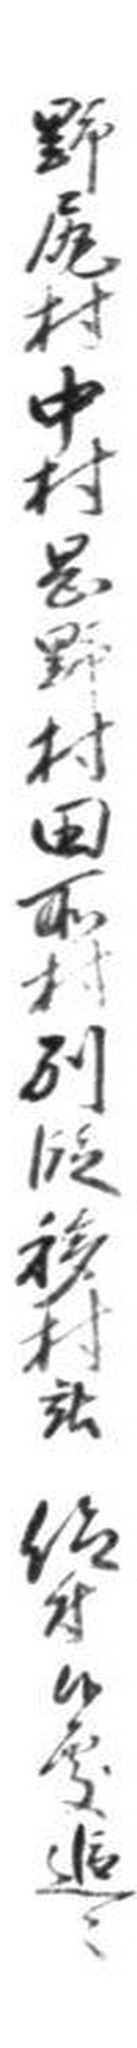野尻村中村岡野村田所村別段移村被仰付候処追々
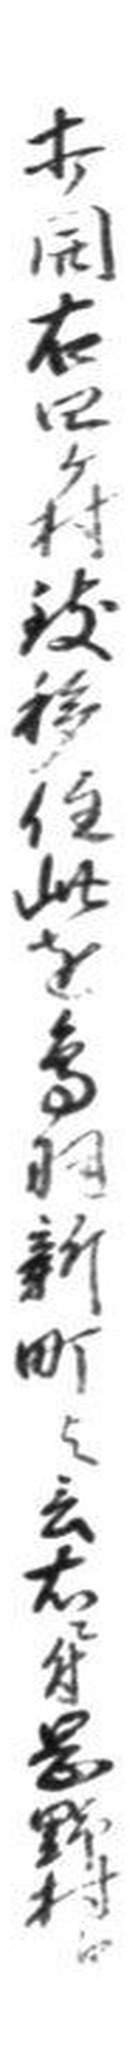打開右四ケ村致移住此を鳥羽野新町与言右ニ付岡野村江
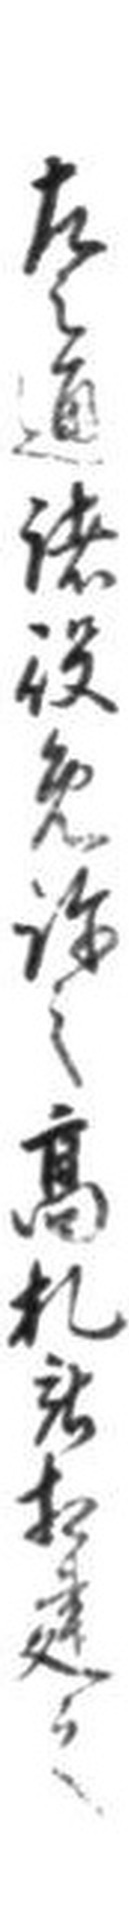左之通諸役免許之高札被相建之
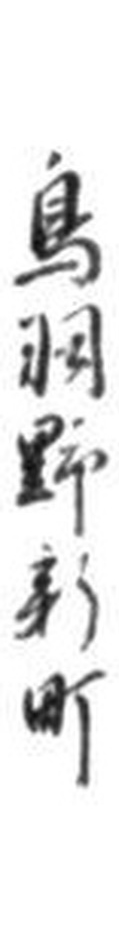鳥羽野新町
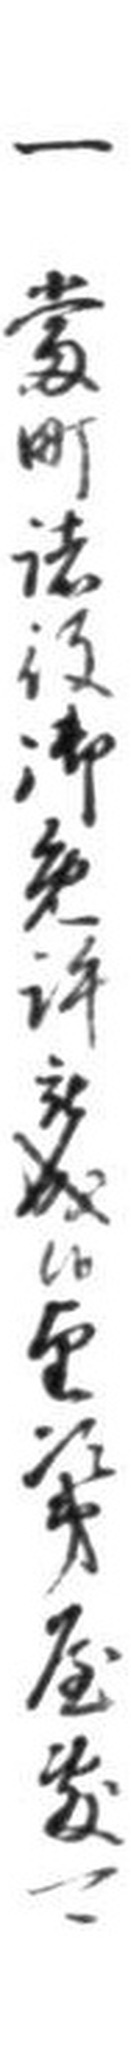一当町諸役御免許被成候望次第屋敷可
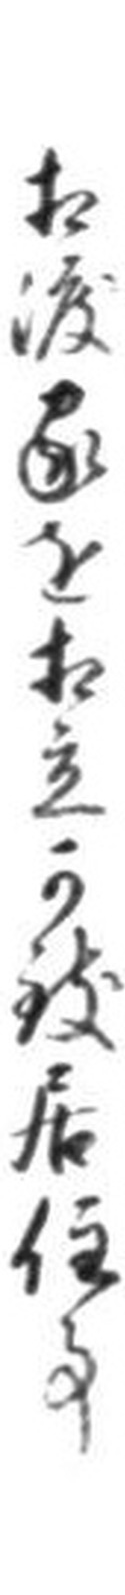相渡家を相立可致居住事
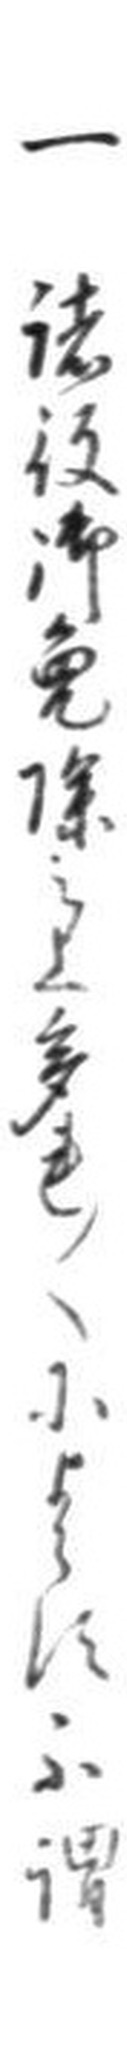一諸役御免除之上たれ〳〵によらす不謂
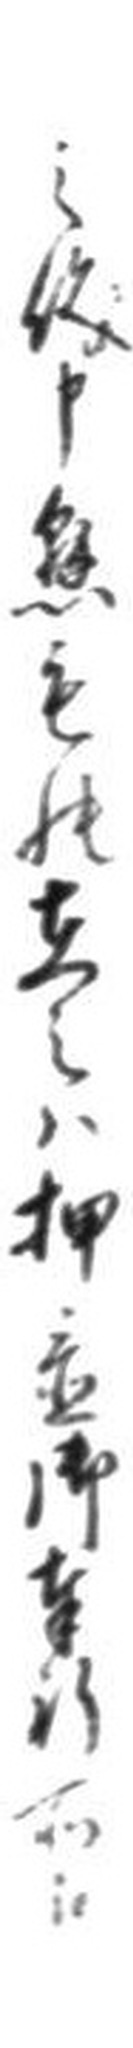之儀申懸もの在之ハ押置御奉行所江
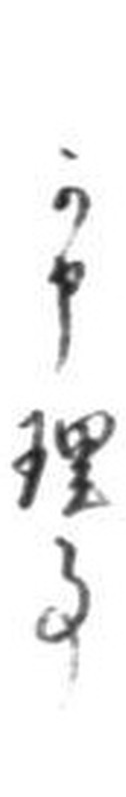可申理事
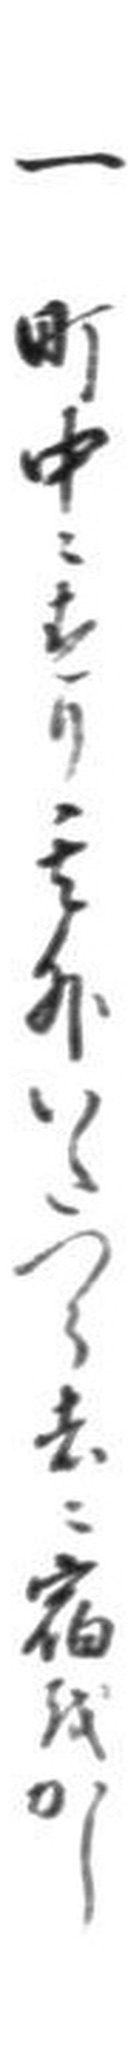一町中ニすり其外いたつら者ニ宿をかし
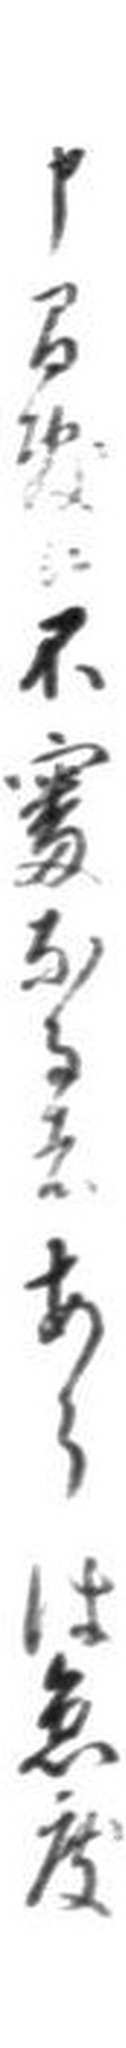申間敷不審なる者あらは急度
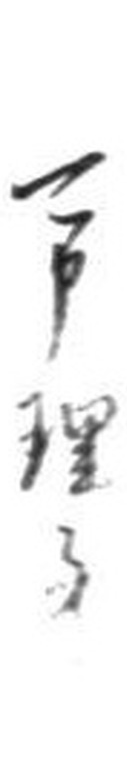可申理事
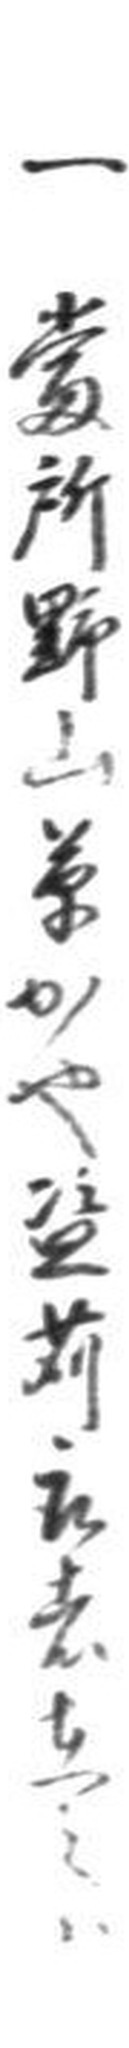一当所野山草かや盗苅取者在之ハ
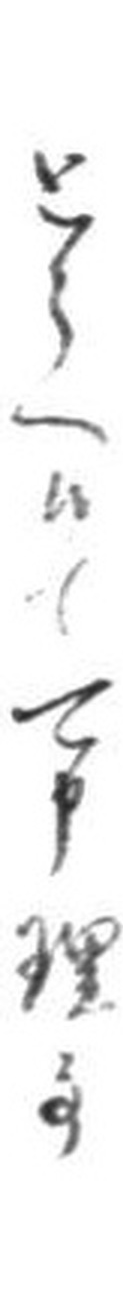とらへ候て可申理事
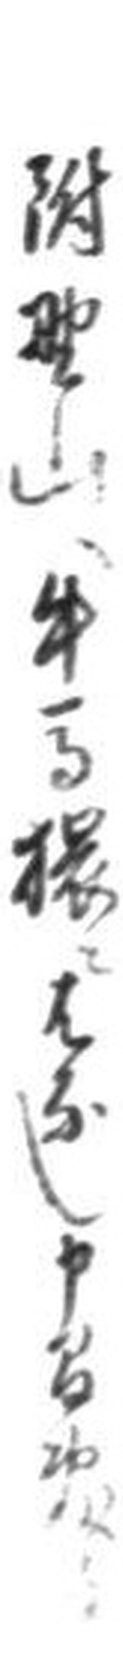附野山へ牛馬猥ニはなし申間敷事
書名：家譜 二 忠直公 従文禄四年到慶安四年
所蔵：福井県文書館 Fukui Prefectural Archives
